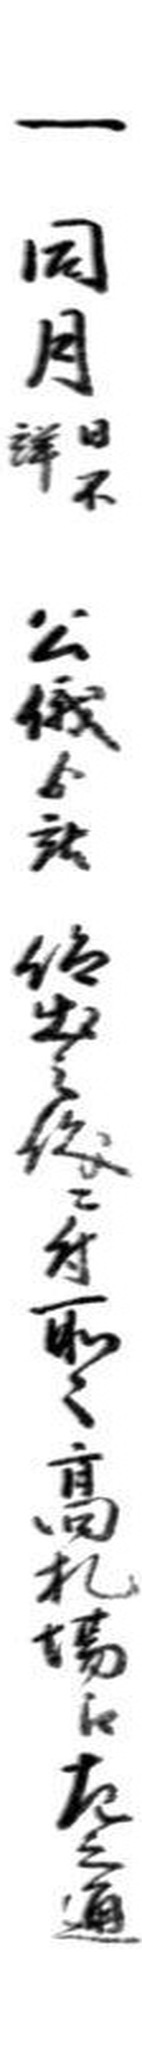一同月日不詳公儀ゟ仰出之儀ニ付所々高札場江左之通
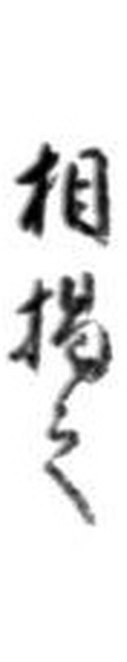相掲之
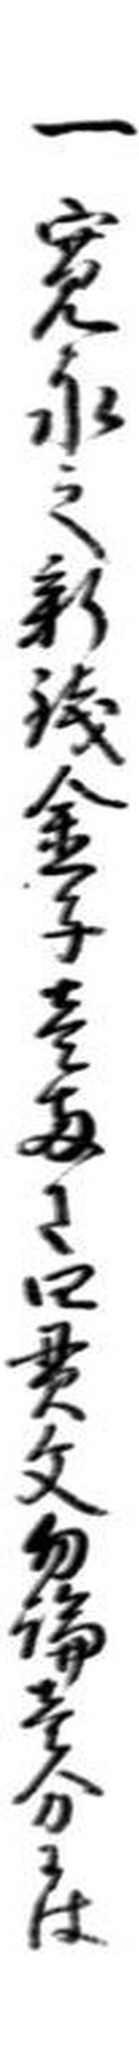一寛永之新銭金子壱両に四貫文勿論壱分には
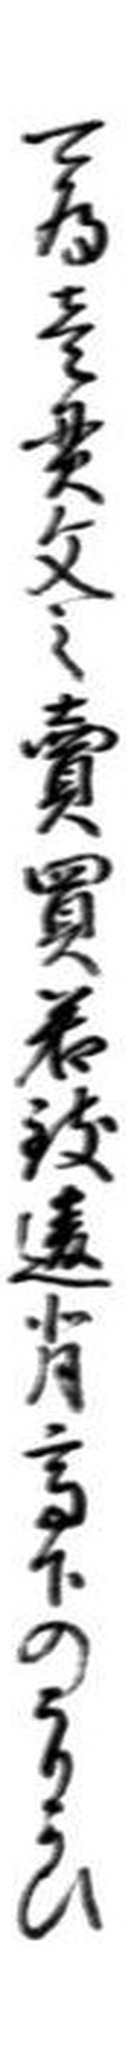可為壱貫文之売買若致違背高下のうりかひ
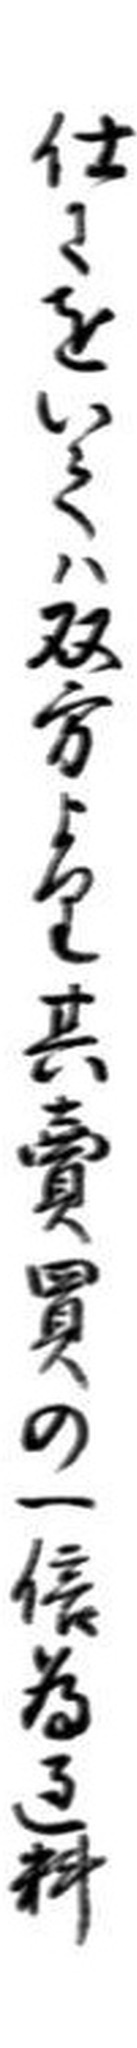仕にをいてハ双方より其売買の一倍為過料
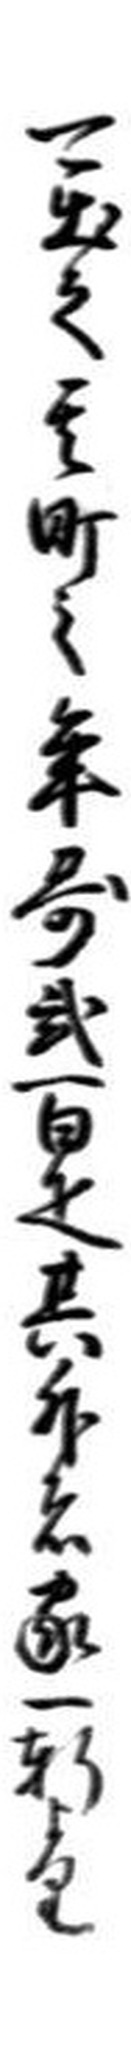可出之其町之年寄弐百疋其外者家一軒より
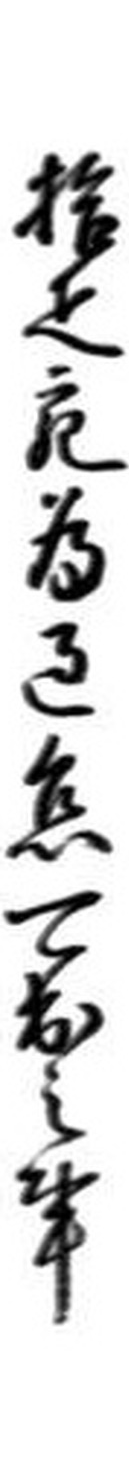拾疋宛為過怠可出之事
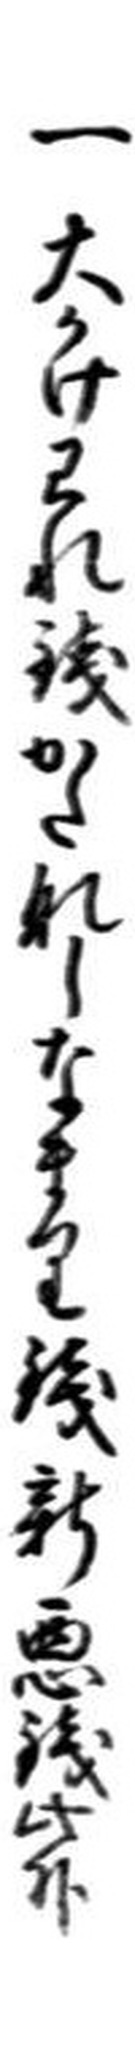一大かけわれ銭かたなしなまり銭新悪銭此外
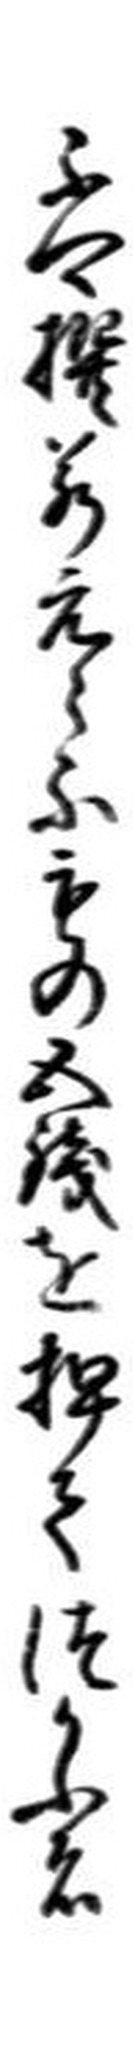不可選若えらふもの五銭を押てつかふ者
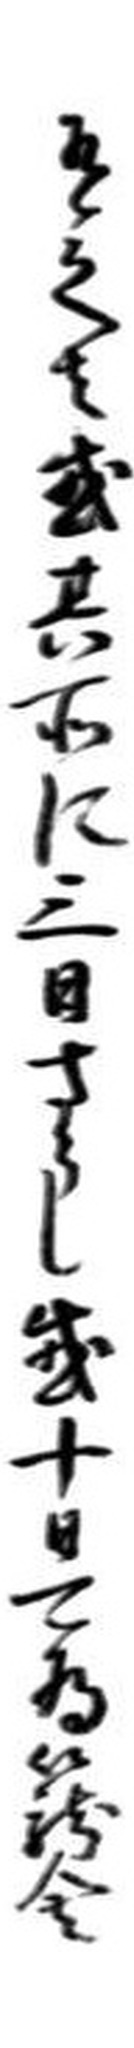有之者或其所に三日さらし或十日可為籠舎

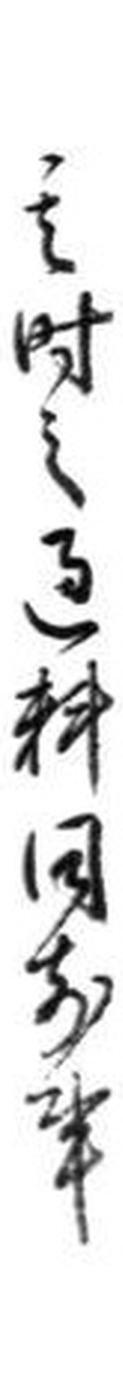其時之過料同前事
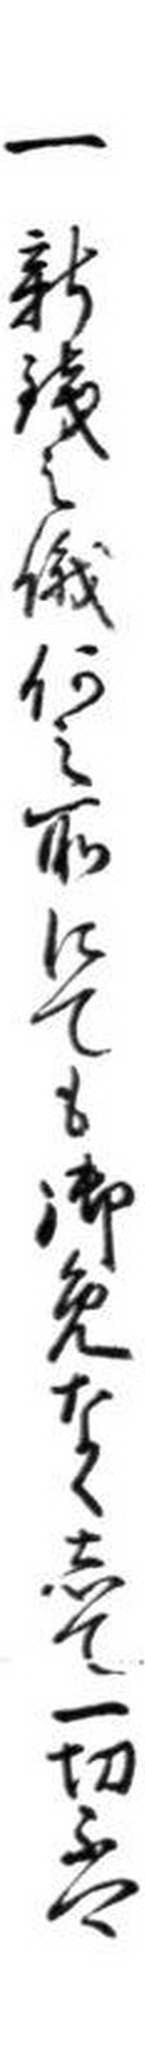一新銭之儀何之所にても御免なくして一切不可
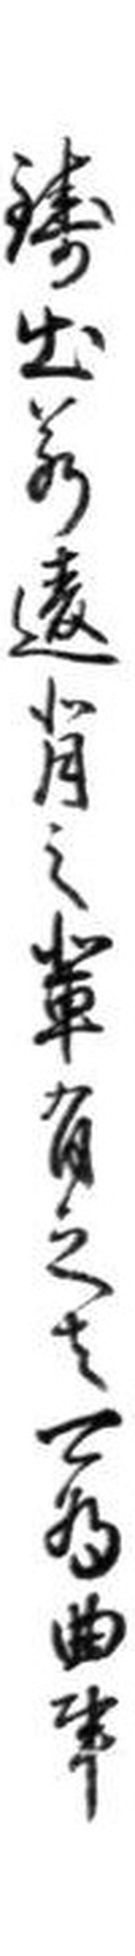鋳出若違背之輩有之者可為曲事
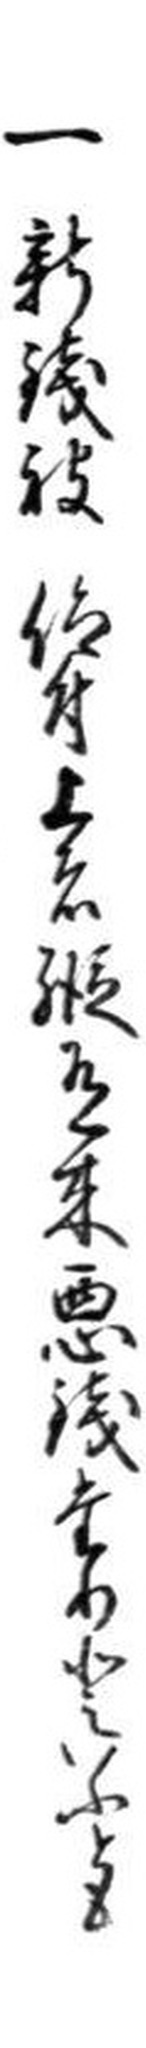一新銭被仰付上者縦有来悪銭たりといふとも
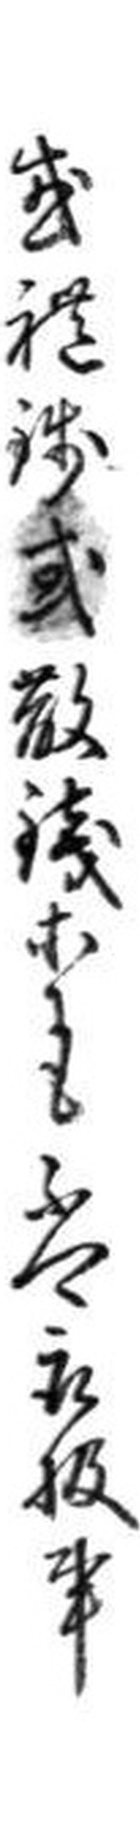或礼銭或散銭等にも不可取扱事
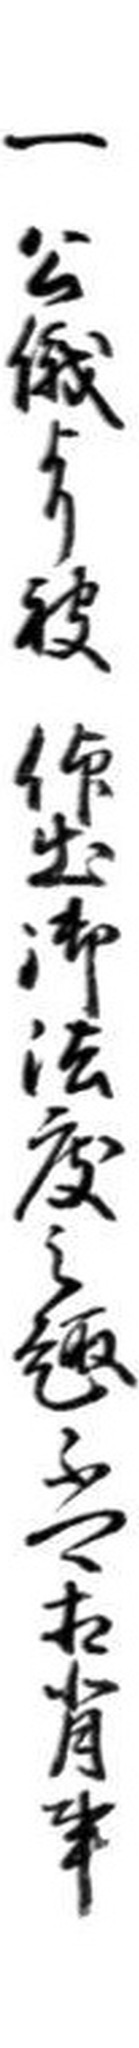一公儀より被仰出御法度之趣不可相背事
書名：家譜 七 光通公 従寛文四年到同九年
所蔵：福井県文書館 Fukui Prefectural Archives
